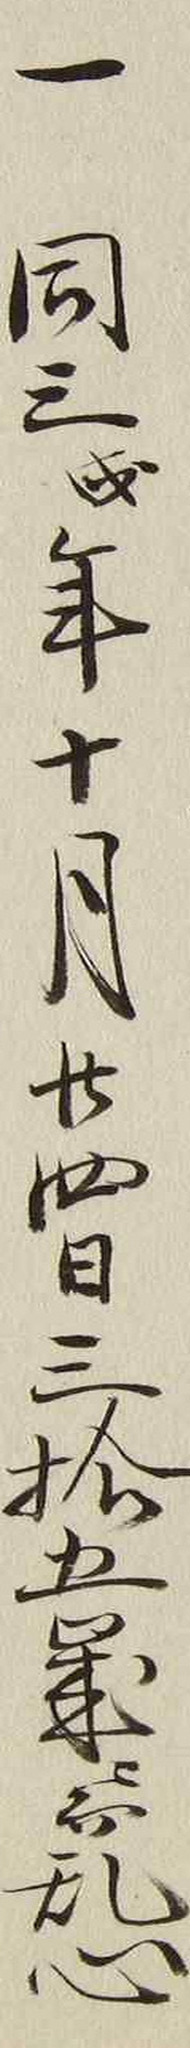一同三戌年十月廿四日三拾五歳ニ而乱心
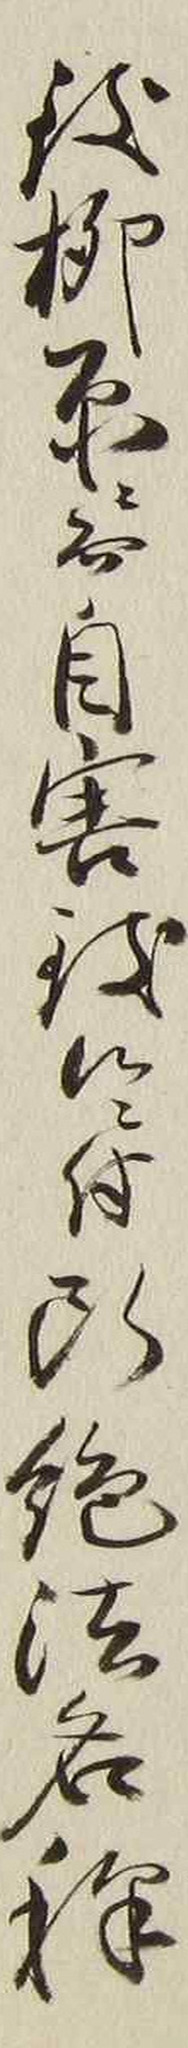致柳原ニ而自害致候ニ付断絶法名釈
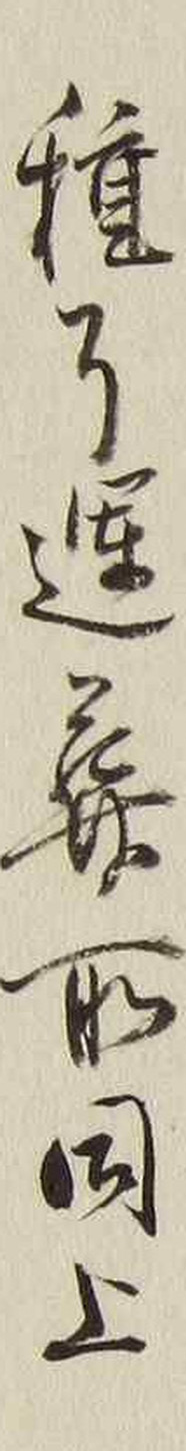種了運葬所同上

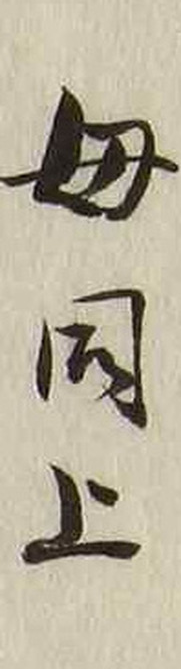母同上
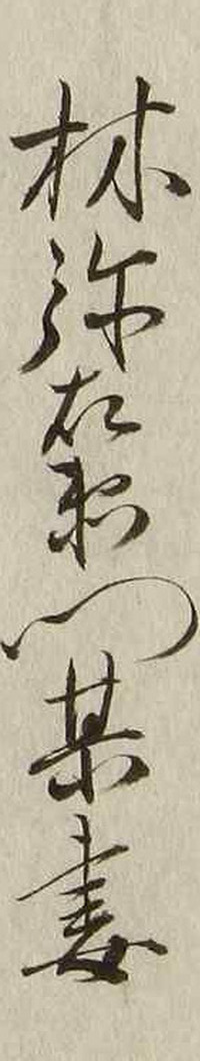女林弥右衛門某妻
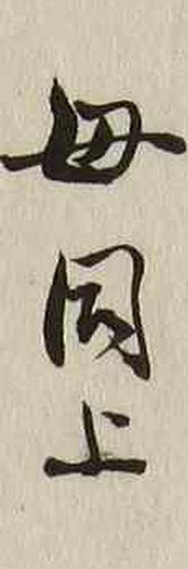母同上
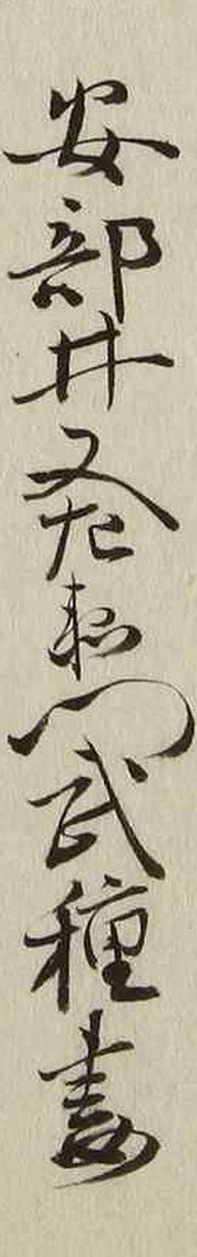女安部井又左衛門武種妻
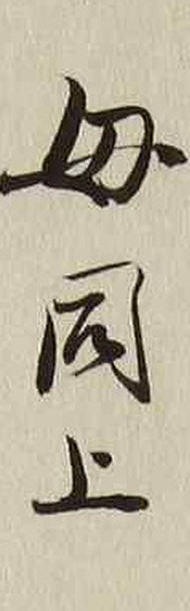母同上
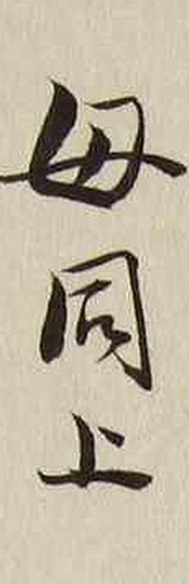母同上

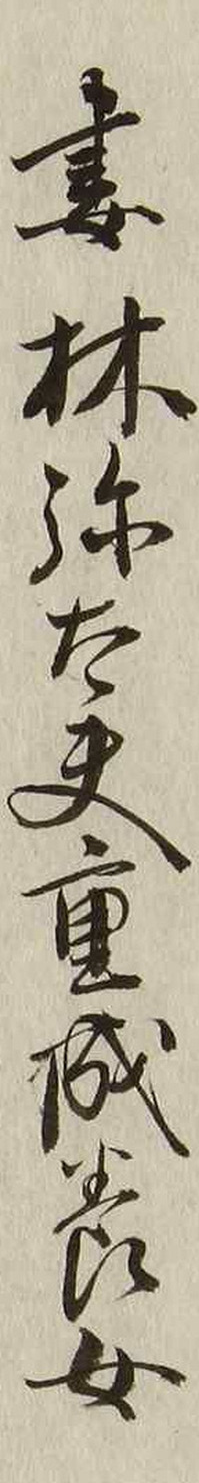妻林弥太夫重成養女
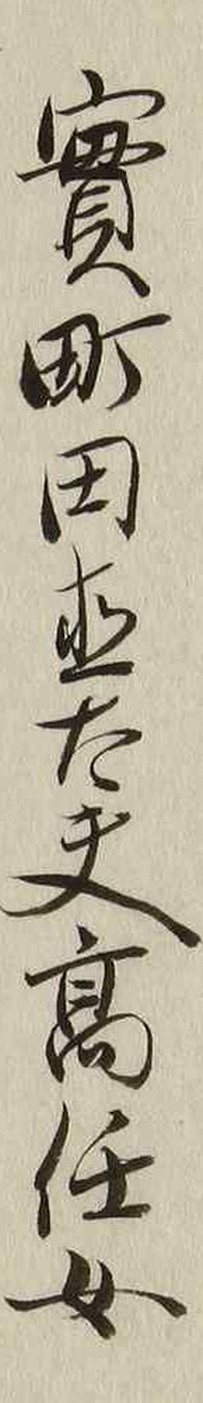実町田直太夫高任女
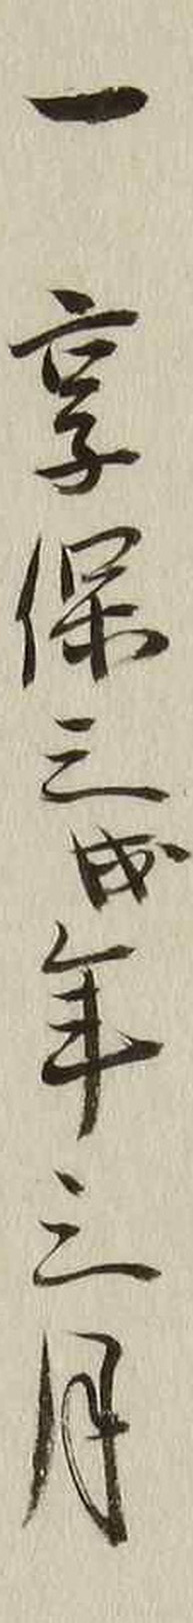一享保三戌年三月
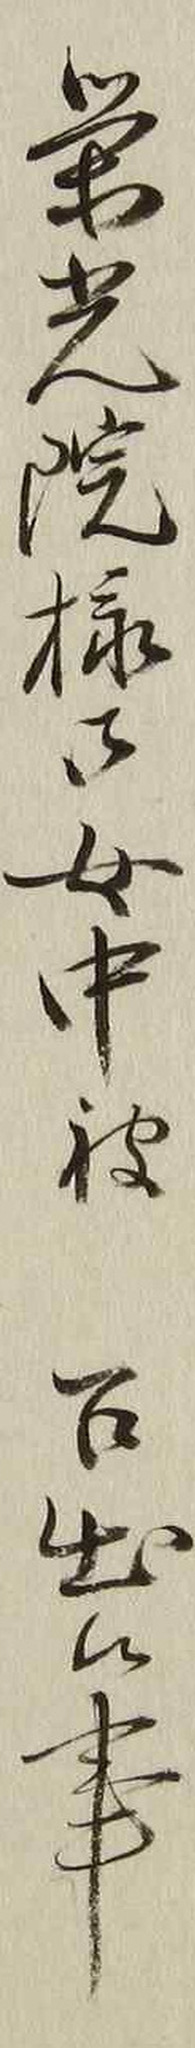栄光院様御女中被召出候事
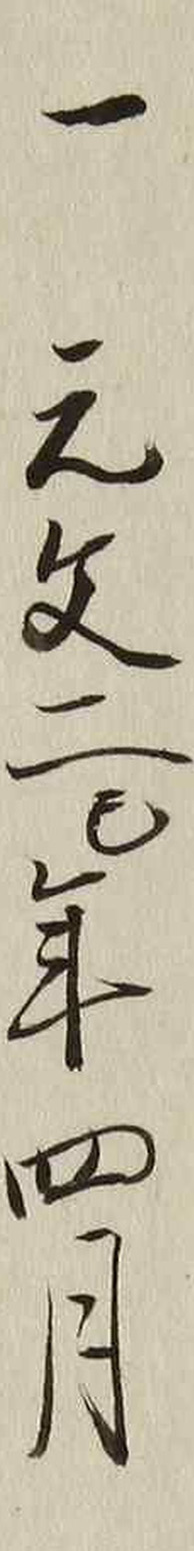一元文二巳年四月
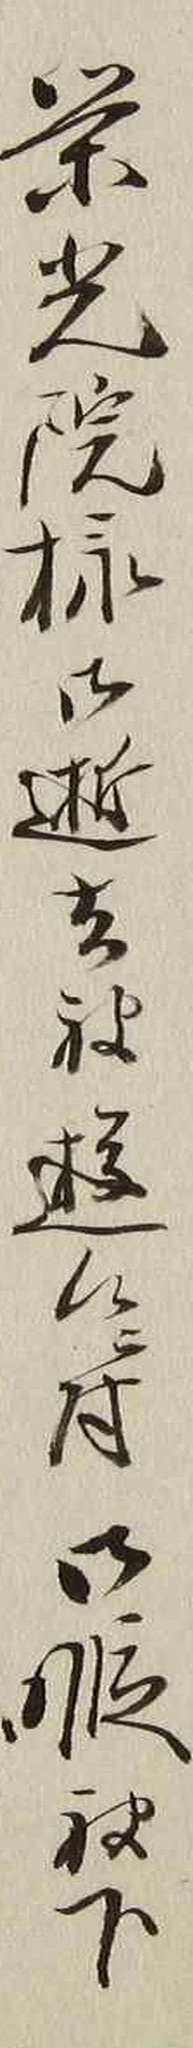栄光院様御逝去被遊候ニ付御暇被下
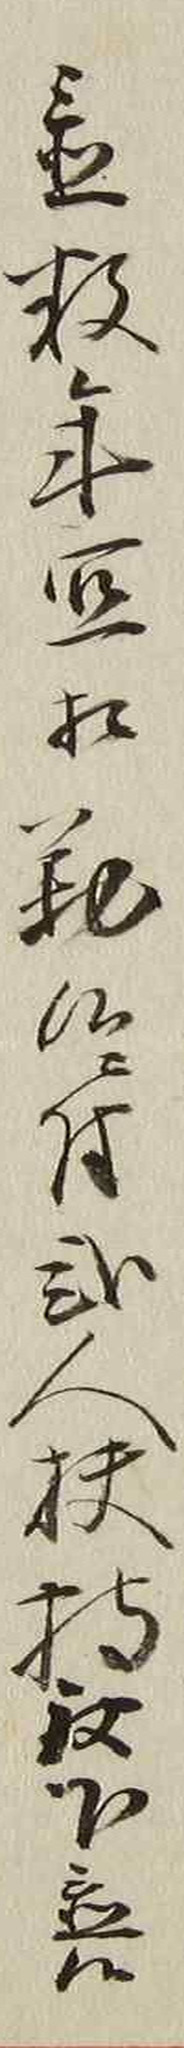置数年宜相勤候ニ付二人扶持被下置候
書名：諸士系譜　巻之163　な之部5
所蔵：会津若松市立会津図書館
